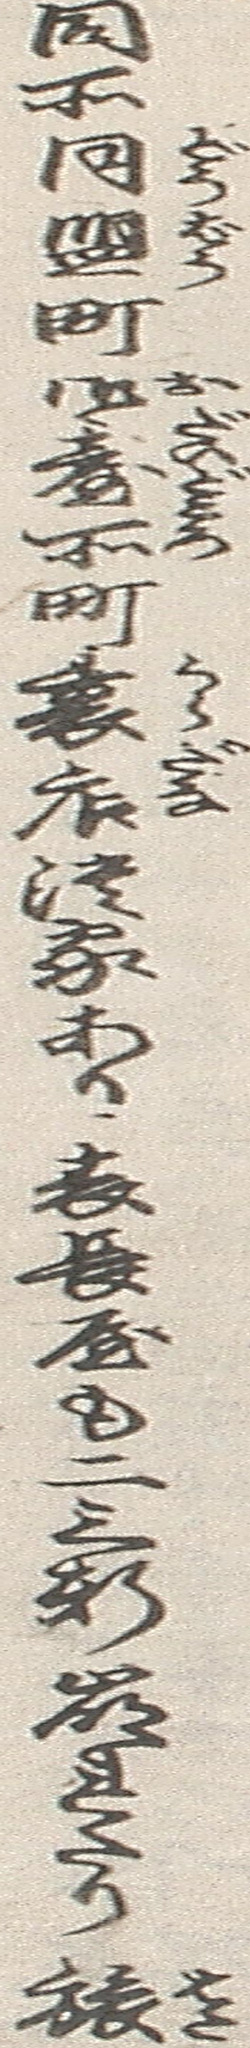同所同盟町御台所町裏店潰家あり表長屋も二三軒崩れたり旅
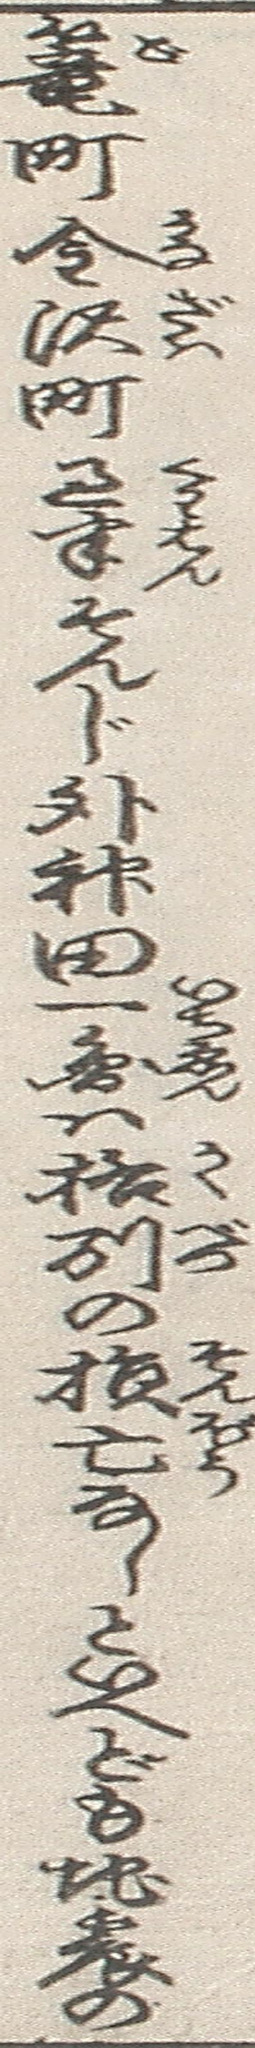篭町金沢町過半そんじ外神田一円は格別の損亡なしといへども地震の
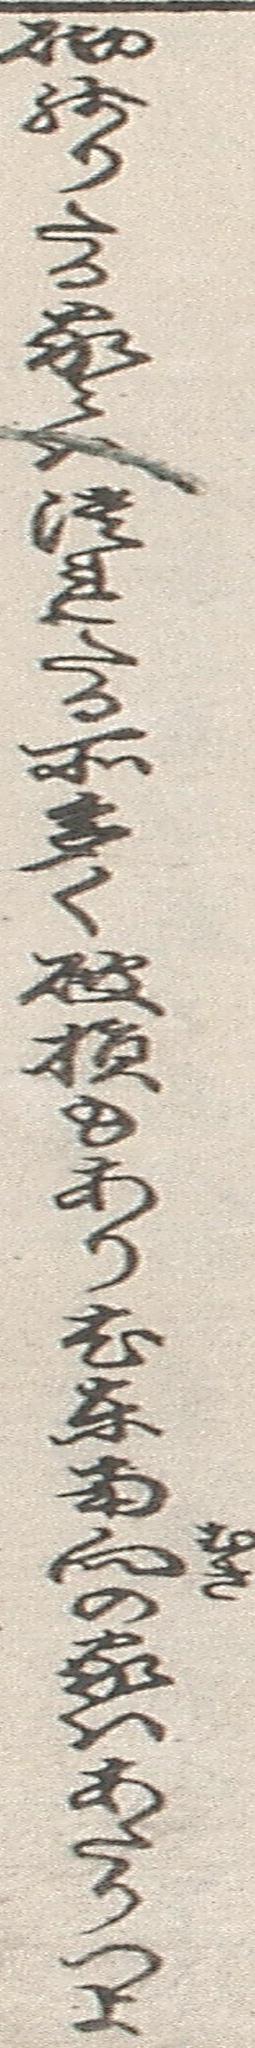砌残りたる家々ハ潰れたる所多く破損もあり尤東南向の家ハあたりつよ
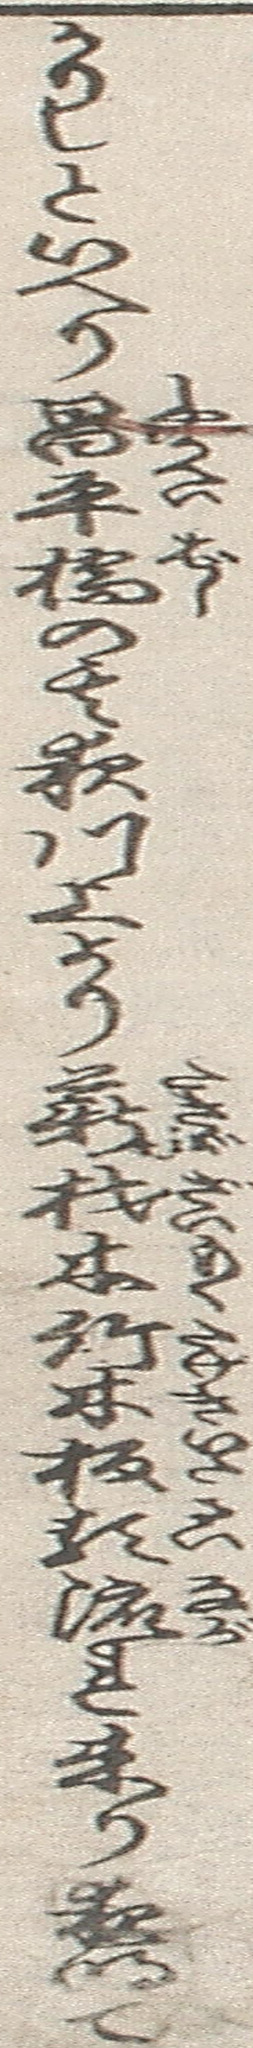かりしといへり昌平橋の其夜川上より薪材木竹板類流れ来り夜明て
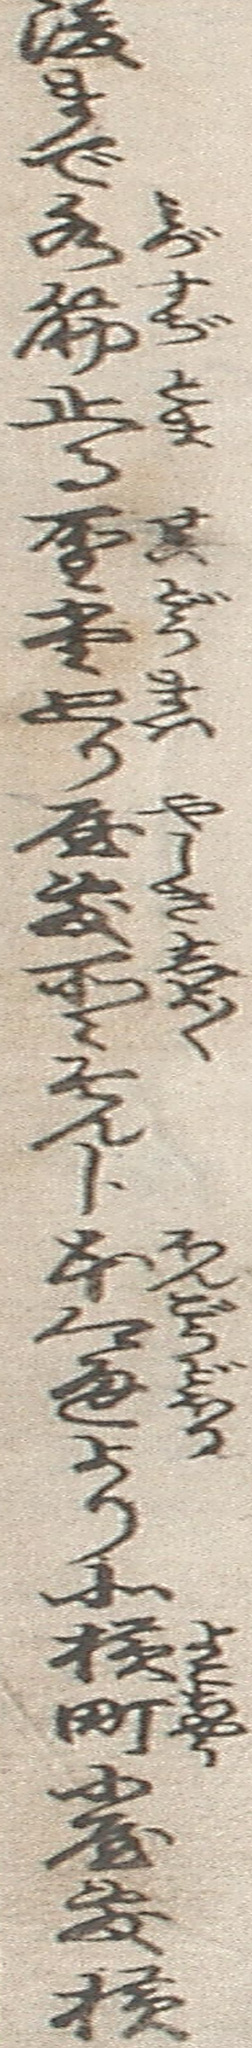後まで水筋止る聖堂廻り屋敷所々そんじ本郷通より北横町小屋敷横

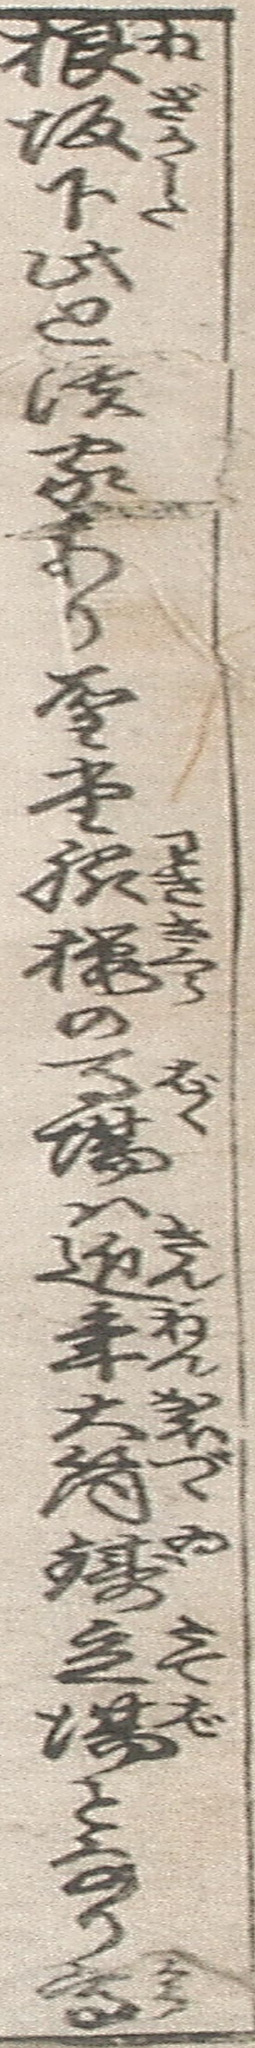根坂下此辺潰家あり聖堂脇桜の馬場ハ近年大筒鋳立場となり高
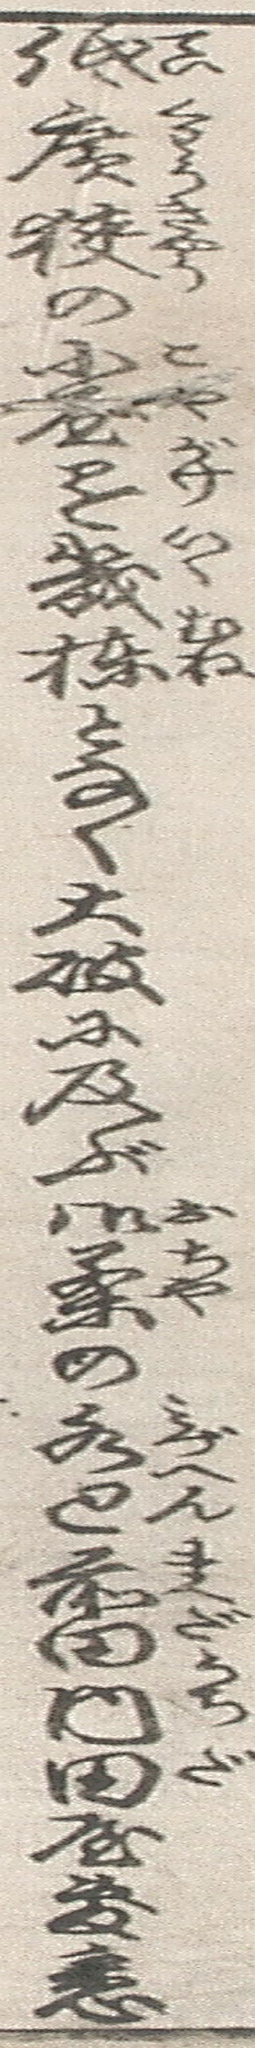低廣狭の小屋懸幾棟となく大破に及ぶ御茶の水辺前田内田屋敷悉
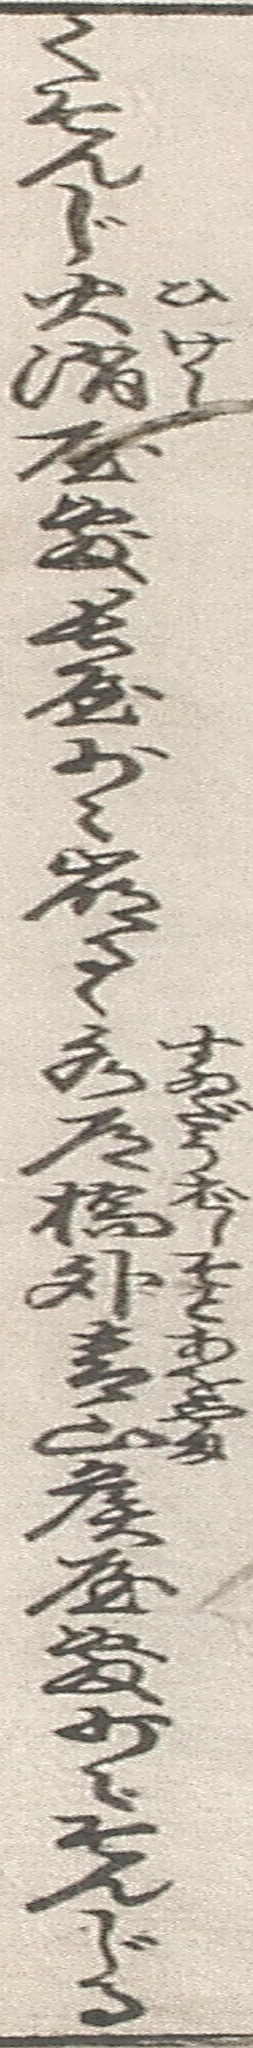くそんじ火消屋敷長屋少々崩るゝ水道橋外青山矦屋敷少々そんじる
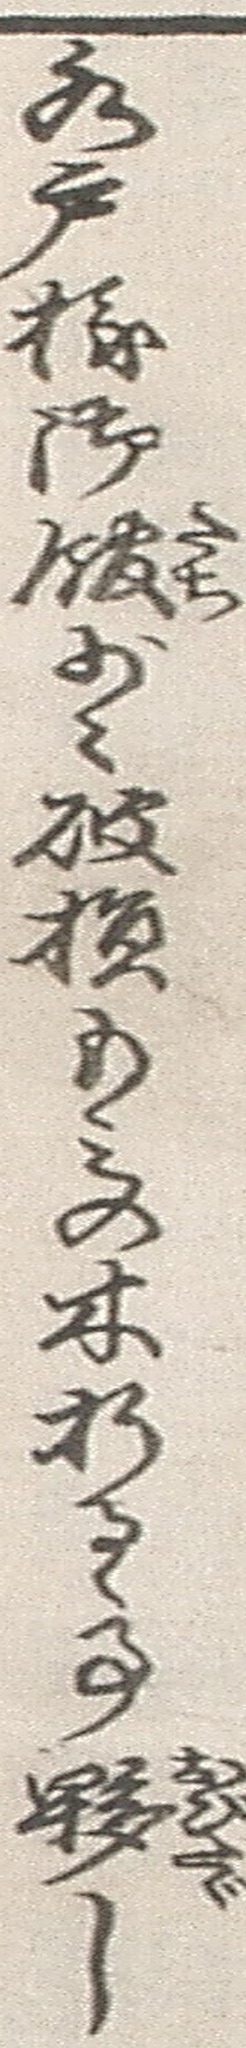水戸様御館少々破損もミノ木折るゝ事夥し
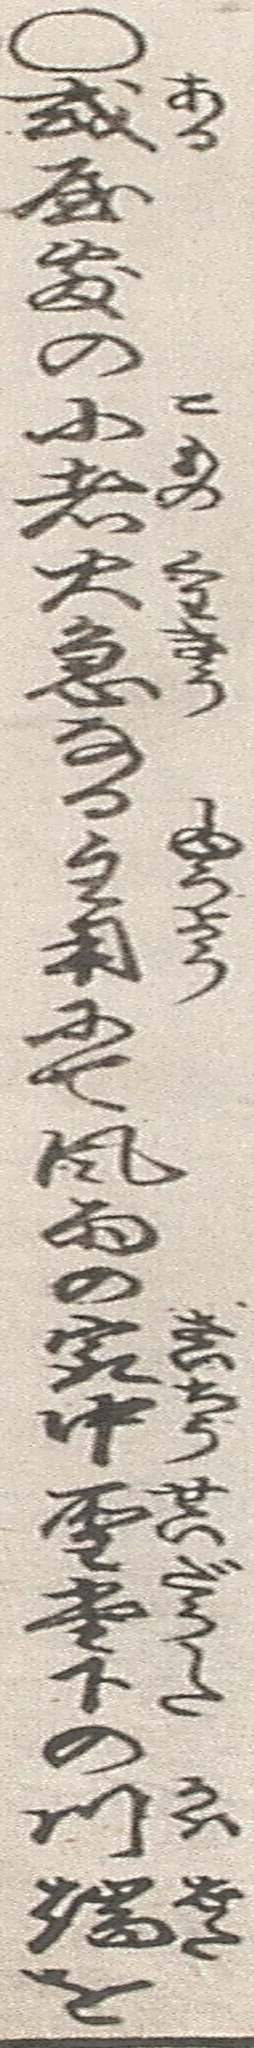◯或屋敷の小者火急なる主用にて風雨の最中聖堂下の川端を
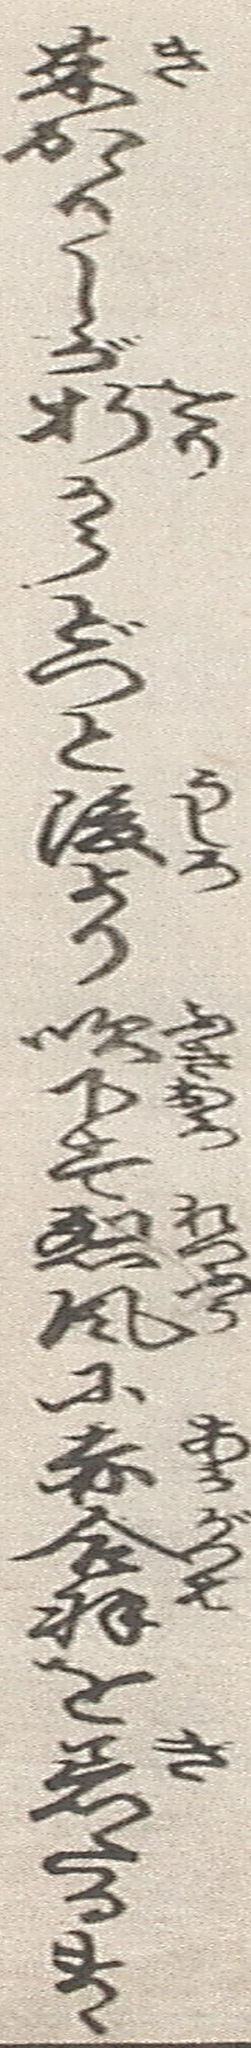来たりしが折からどつと後より吹下す烈風に赤合羽を着たるまゝ
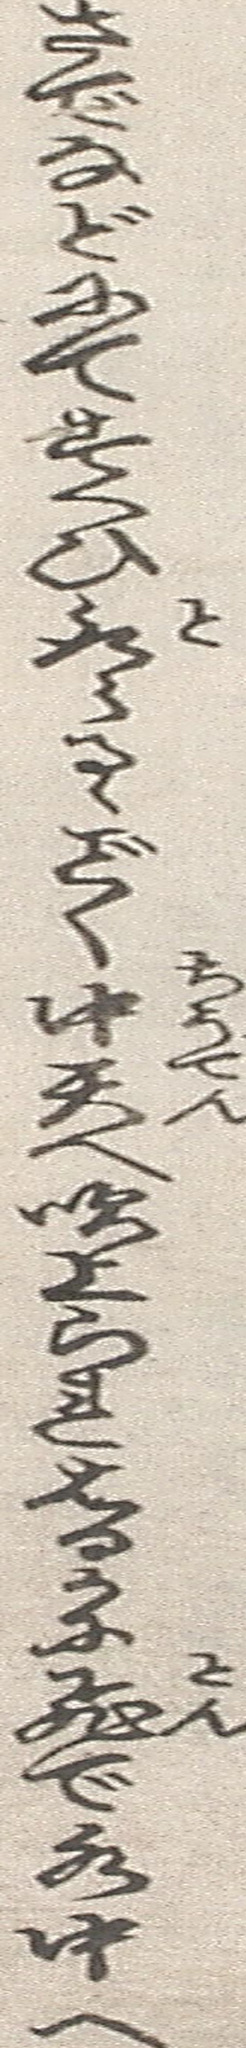さでなどにてすくひ取らるゝごとく中天へ吹上られはるかに飛で水中へ
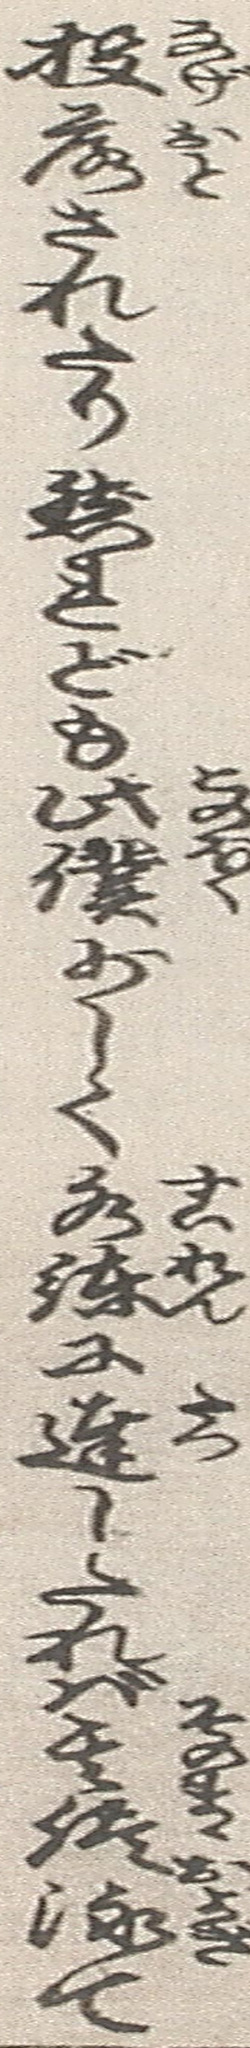投落されたり然れども此僕少しく水練に達したれバ其侭泳て
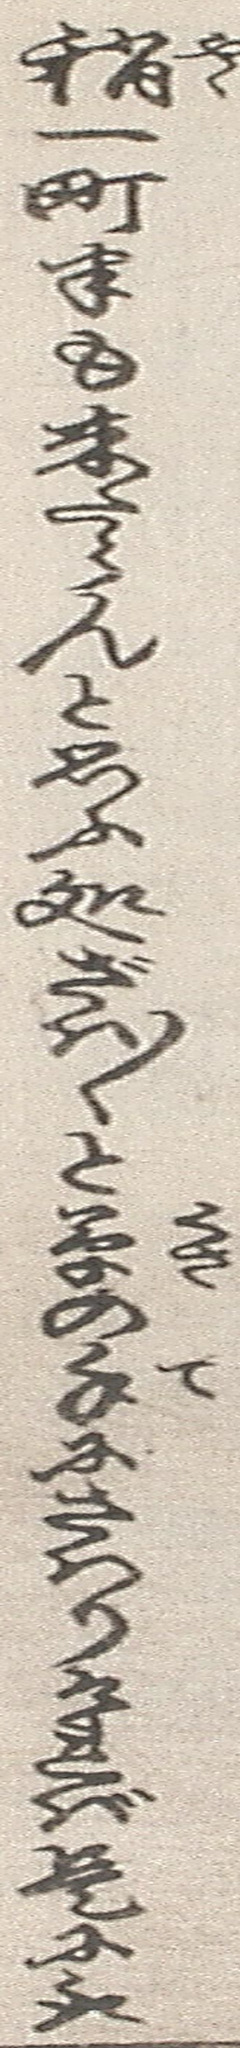稍一町半の来たらんと思ふ処ざハ〳〵と草の手にさわりけれバ是に取
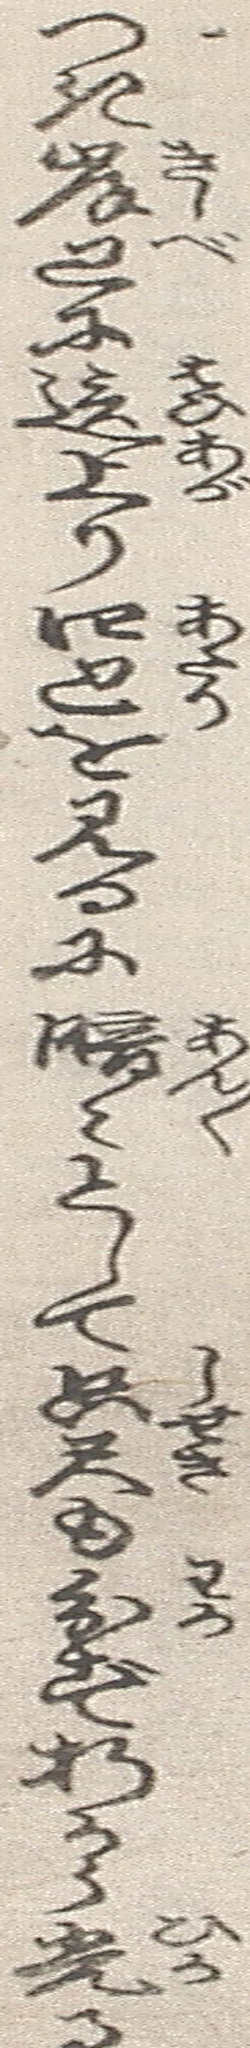つき岸辺に這上り四辺を見るに暗々として只尺も分ず折から光る
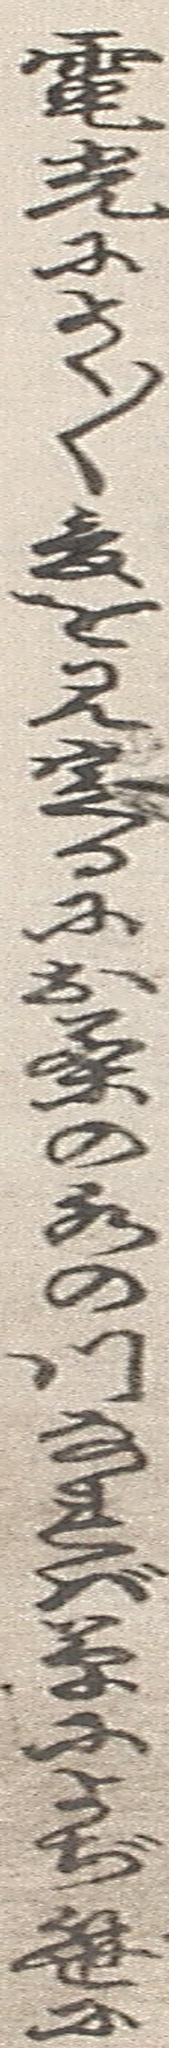電光によく〳〵爰を見定るにお茶の水の川なれバ草によぢ笹に
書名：安政風聞集　上中下　全
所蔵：東京大学地震研究所図書室 Earthquake Research Institute Library, The University of Tokyo, JAPAN
